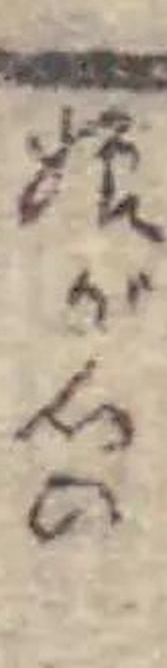娘が心の
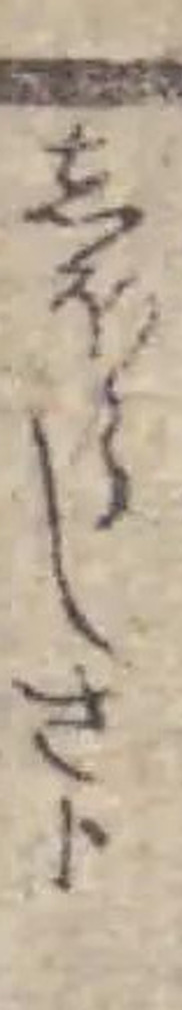しほらしさと
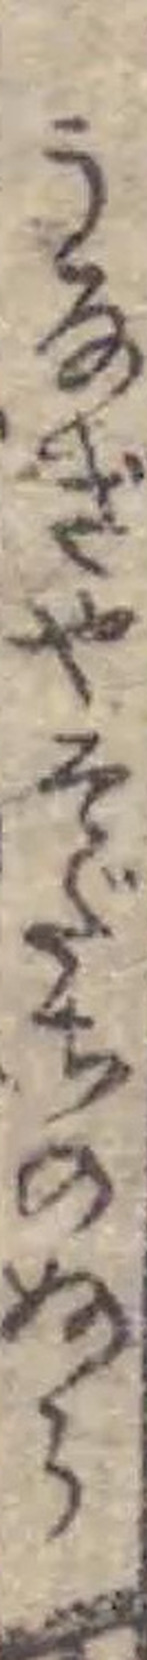うなぎやそだちのぬら
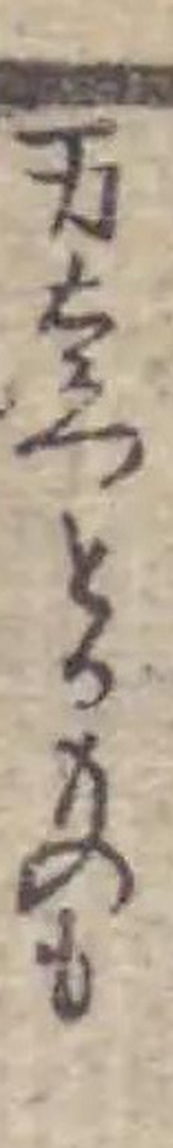万右衛門とるものも
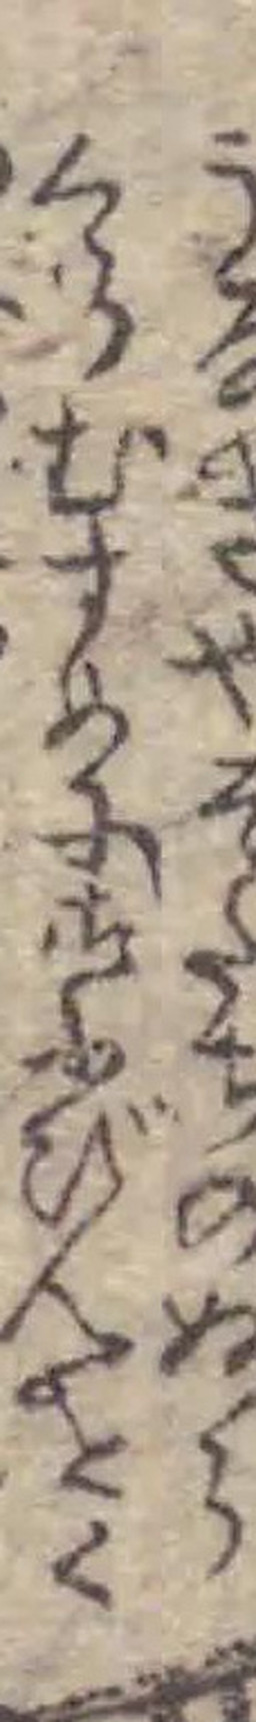くらむすめに御ふびんをく
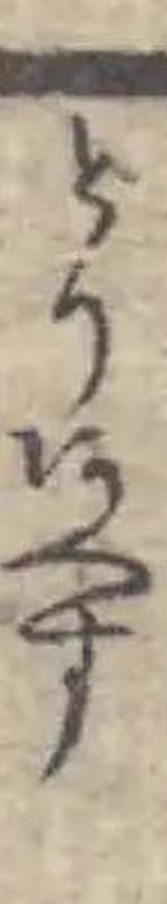とりあへす
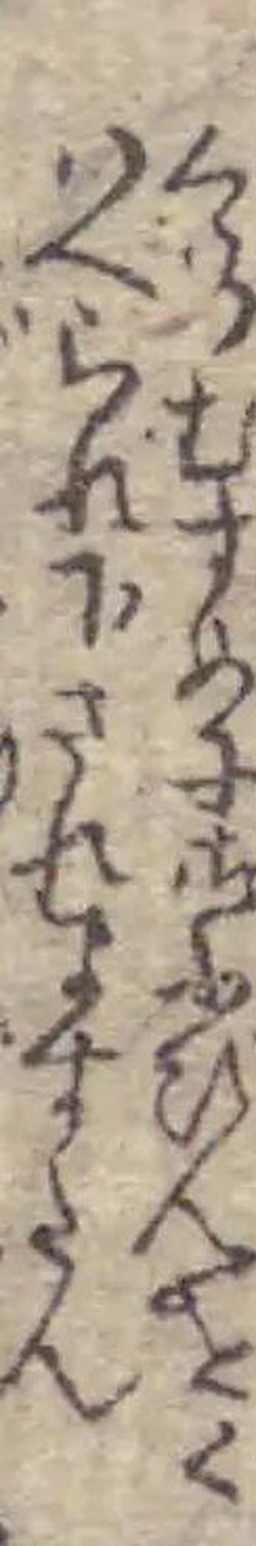はへられ下されますたん
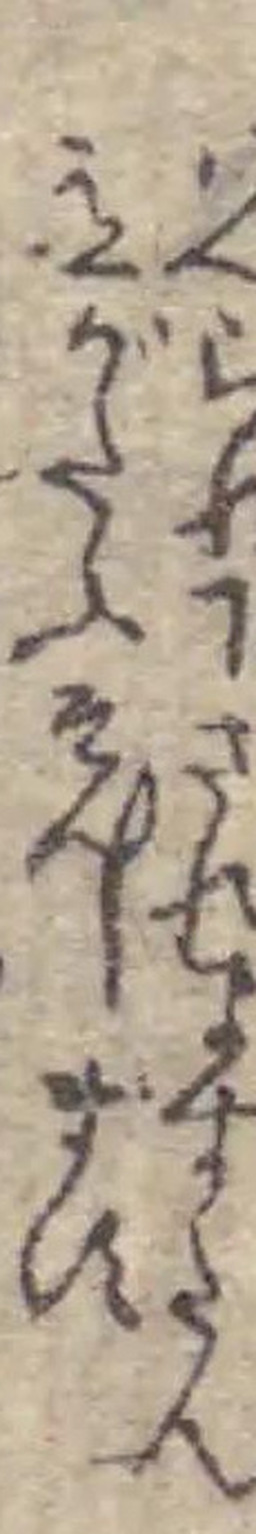有がたふそんします
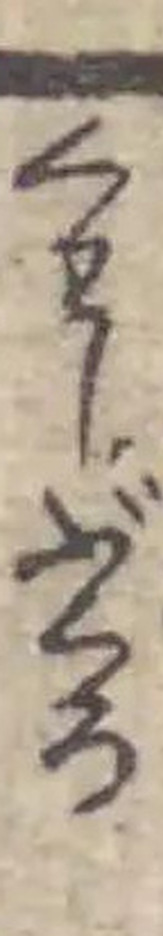くわしぶくろ
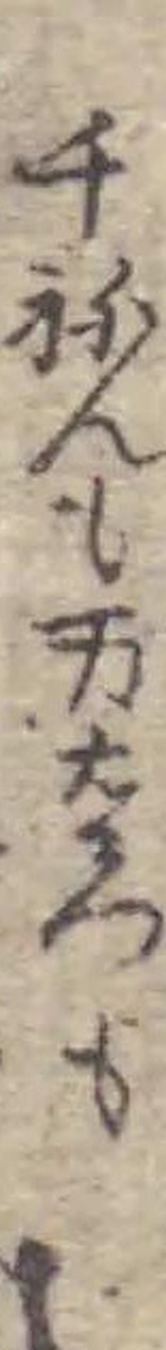千ねんも万右衛門も
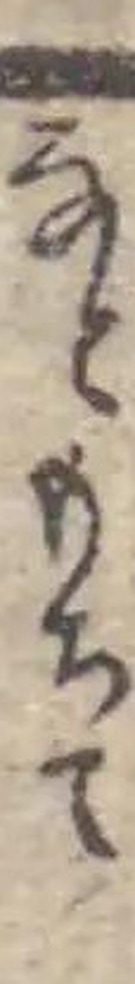などもちて
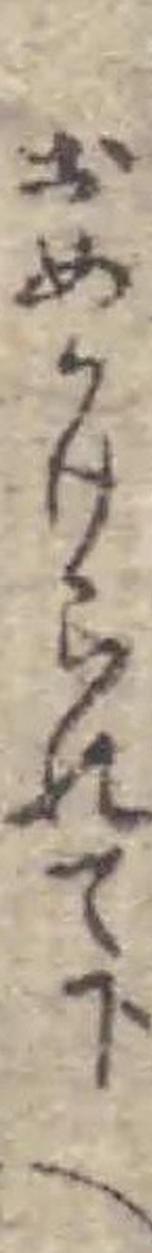おめかけられて下
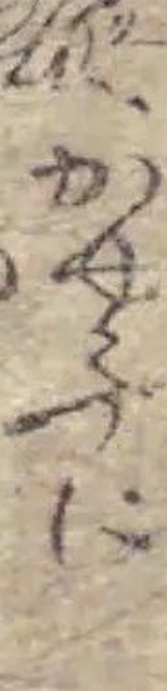かやうに
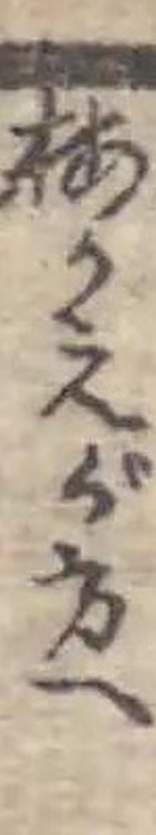梅かえが方へ
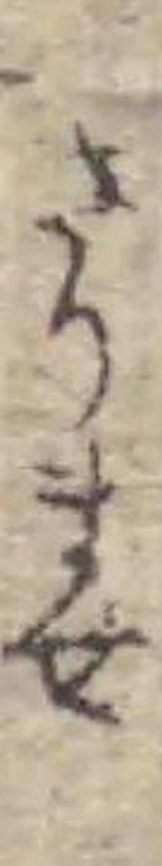さりませ
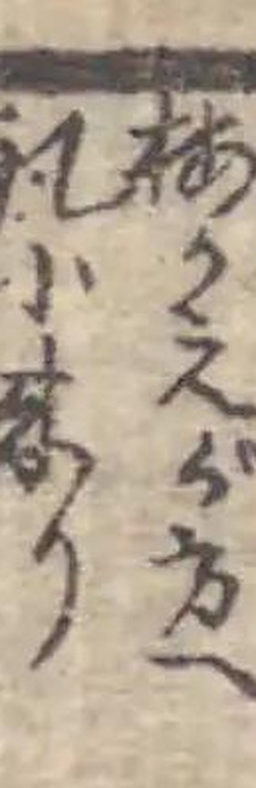礼に来り
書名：見立蓬莱 : 2巻
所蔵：国立国会図書館 National Diet Library, JAPAN
